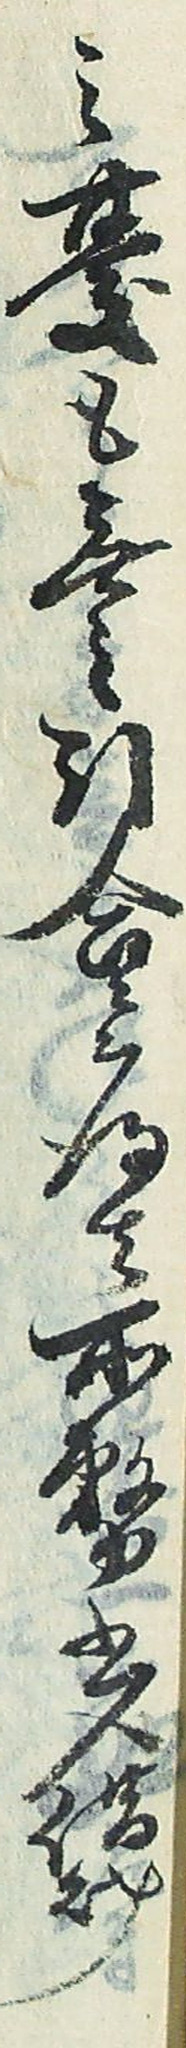之慶も無之引合ニ候得者所務書入借財
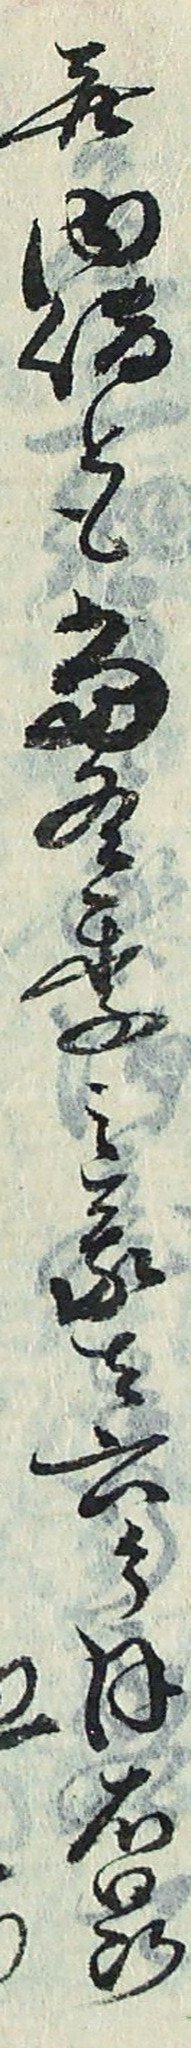幷内借とも當冬季之義者六ケ月右同断
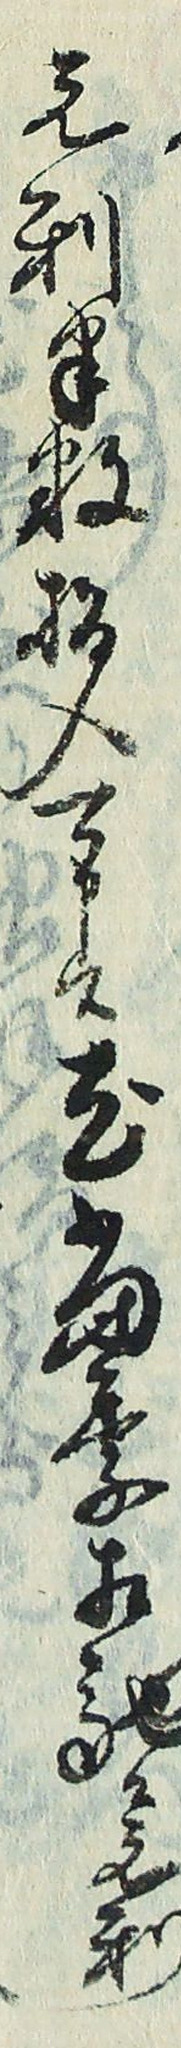元利半数指入可申候尤當季相馳候元利
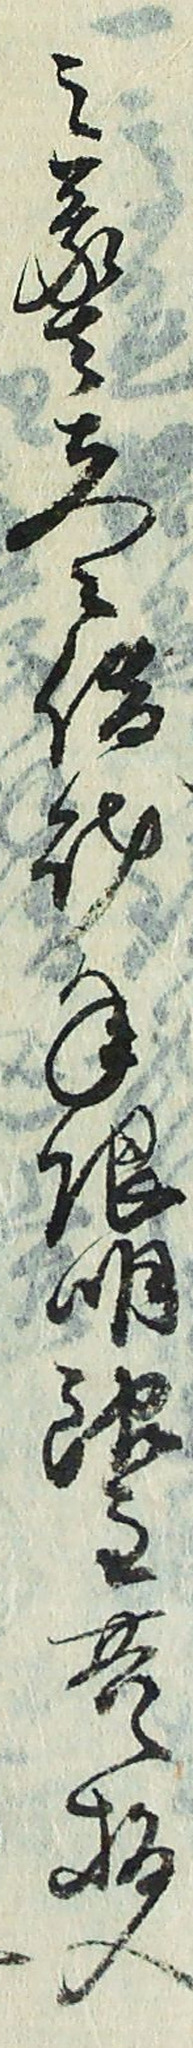之義者夫々借財年限明銀主共へ指入
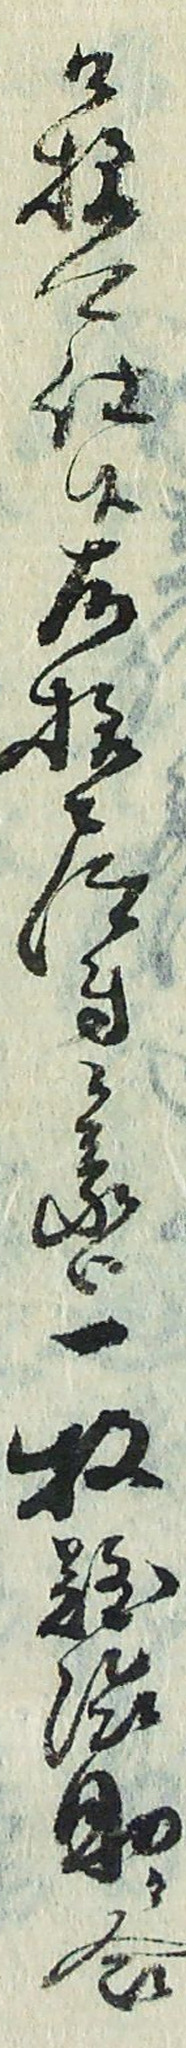候様可仕候右様被仰付候義ハ一牧難渋助ケ合
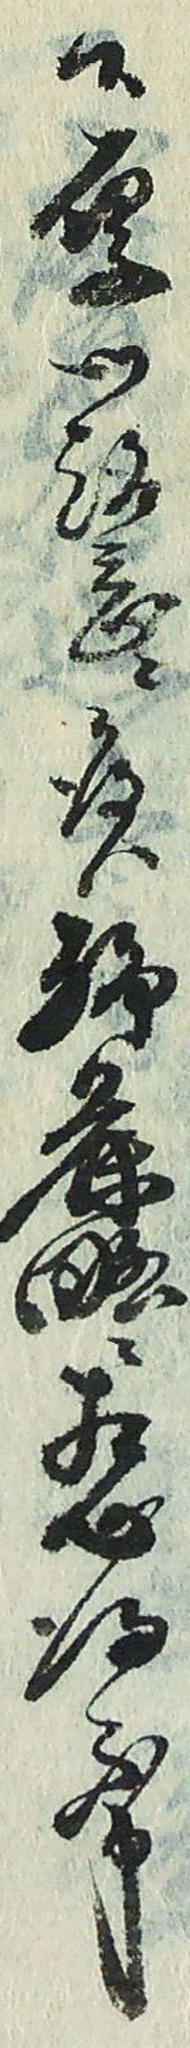候厚御趣意ニ候得ハ聊麁略ニ相心得不申
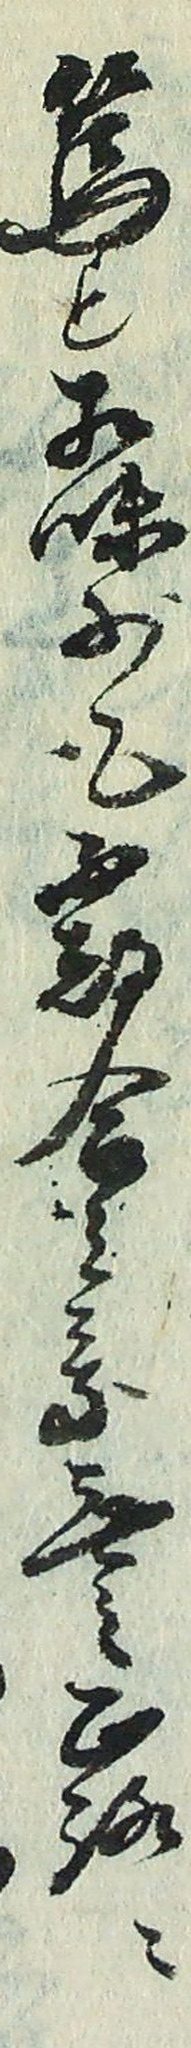篤と相味少も不都合之義無之正路ニ
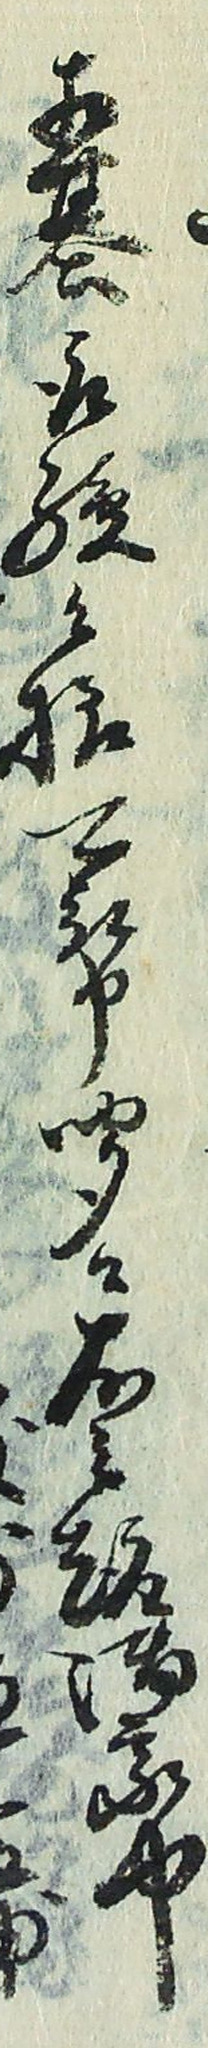相基取續候様可被申聞候右之趣御家中
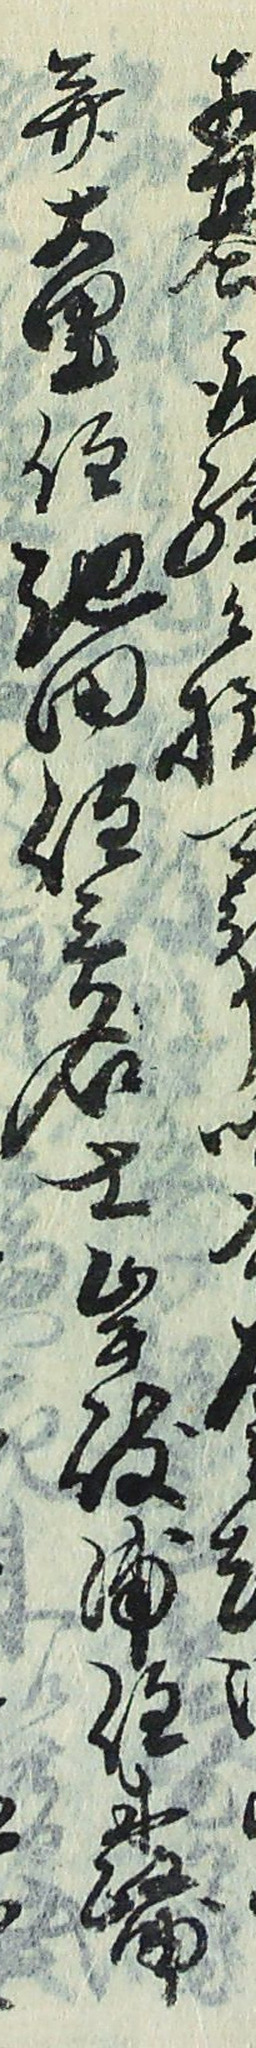幷大里住池田住三名士牟岐浦住木岐浦
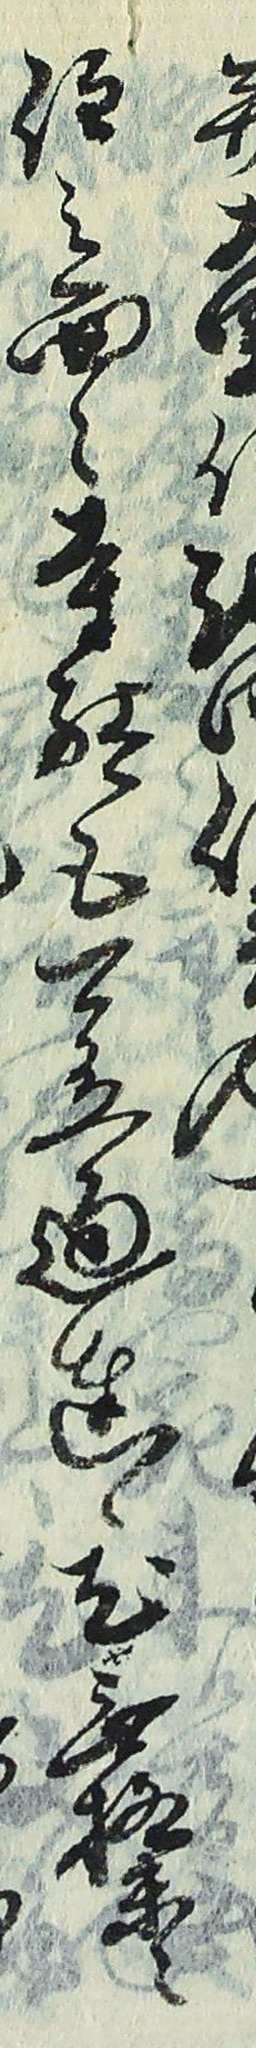住之面々寺社へも可有通達候尤無格末々
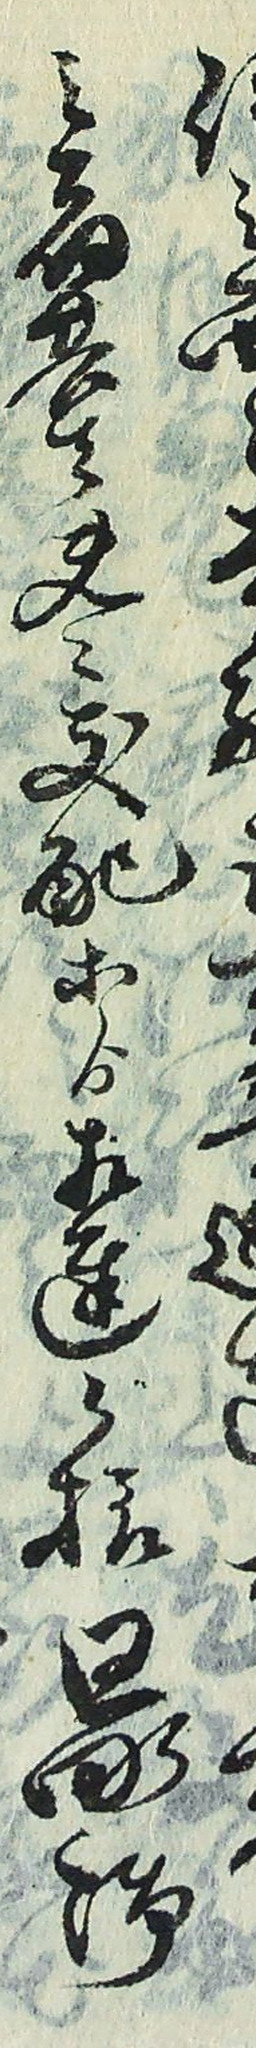之者共者夫々支配等ゟ相達候様且町御
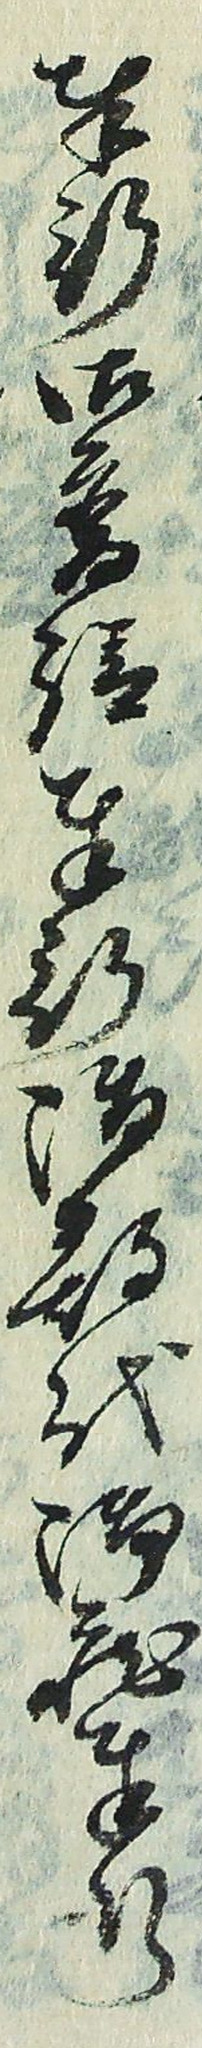奉行御普請奉行御郡代御蔵奉行
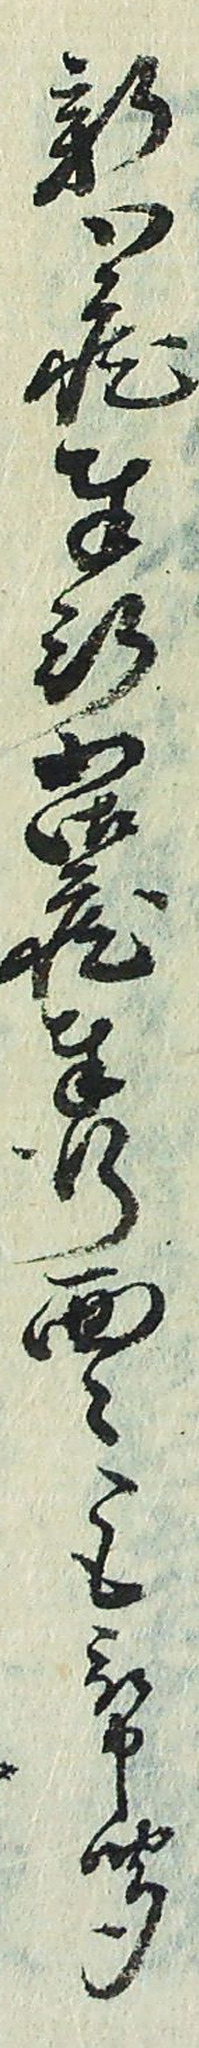新御蔵奉行北御蔵奉行面々へも被申聞
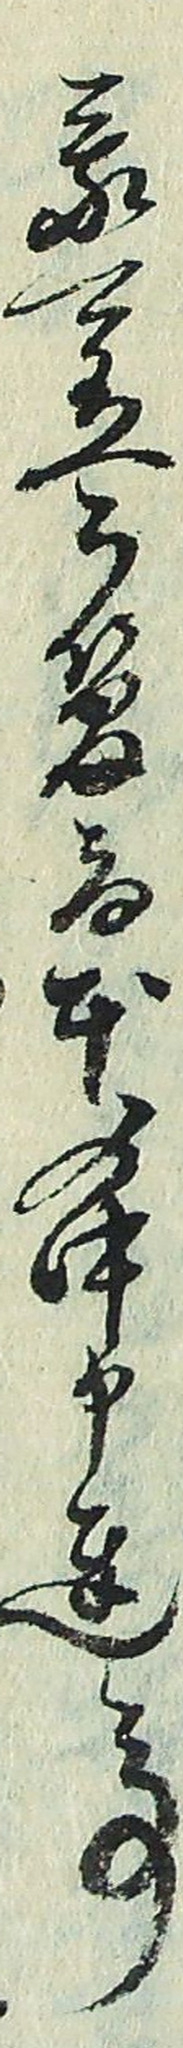義可有了簡旨本〆中申達候事
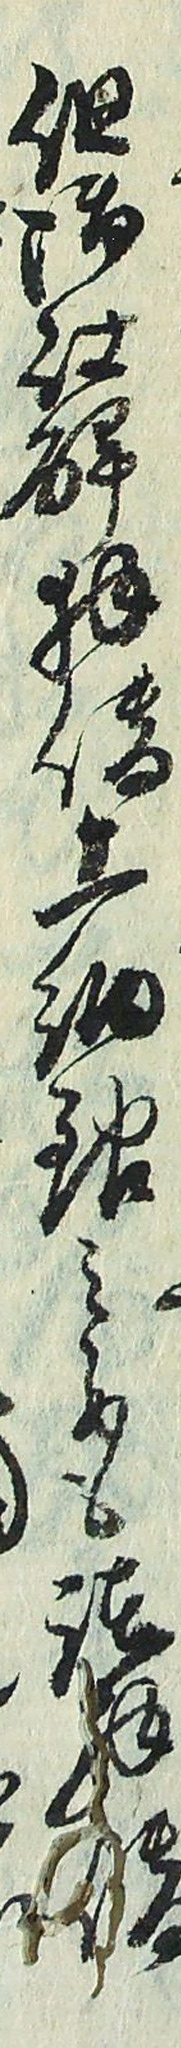但御仕解拝借上納銀之義も諸拝借
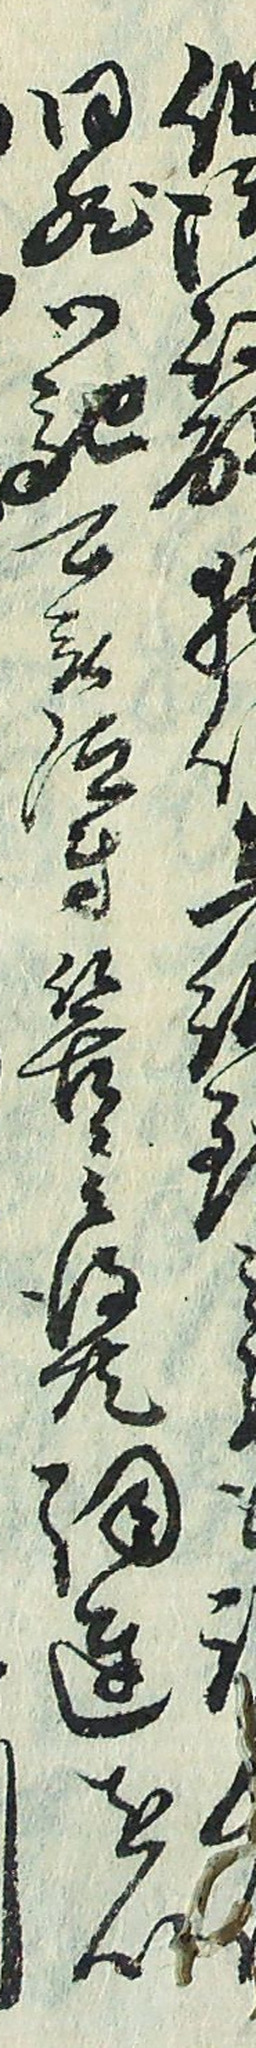同然御馳可被仰付筈ニ候得共調達を以
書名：諸御趣意書并御下知向之写
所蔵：鳴門教育大学 Naruto University of Education
